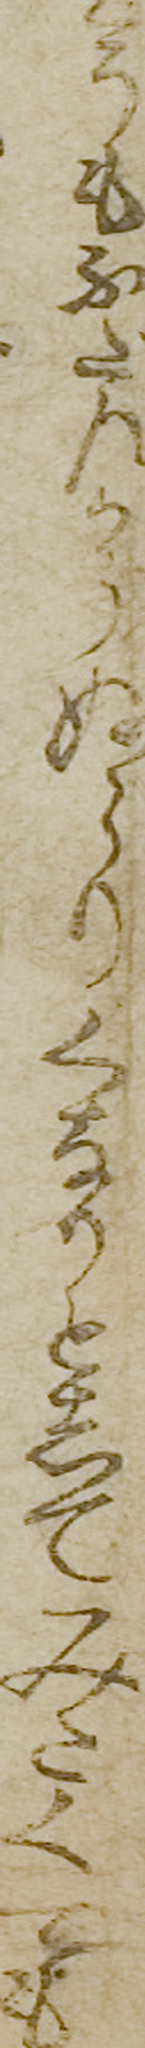どうもふだんからぬらりくなりとしてみたくても
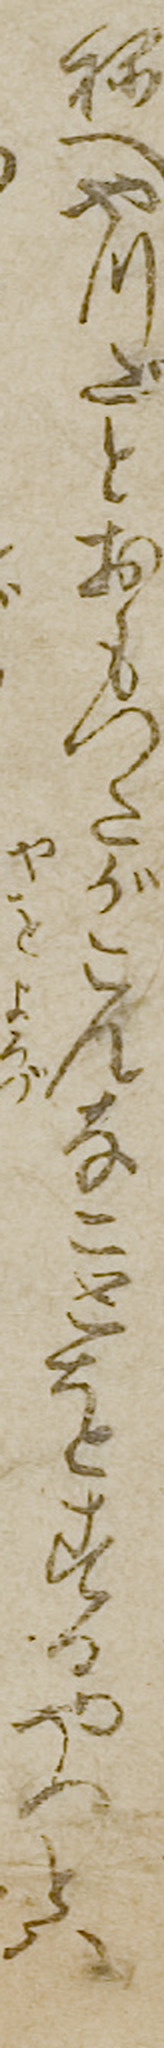ねへやつだとおもつたがこんなことをするやつとは
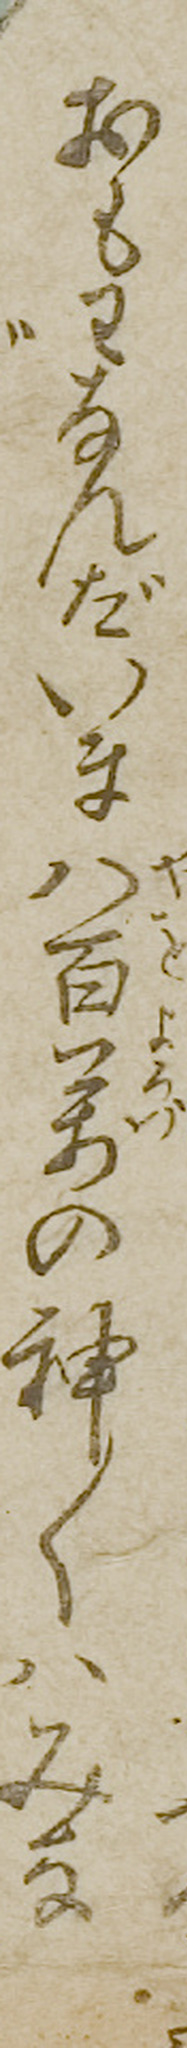おもわなんだいま八百万の神＼はみな
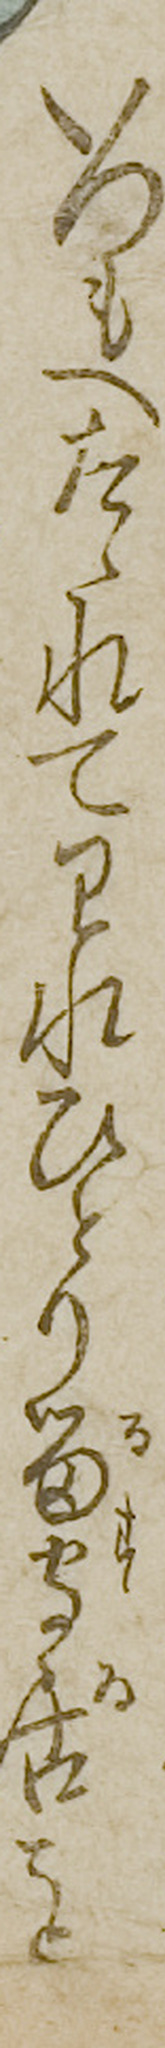いづもへたゝれてわれひとり留守居を
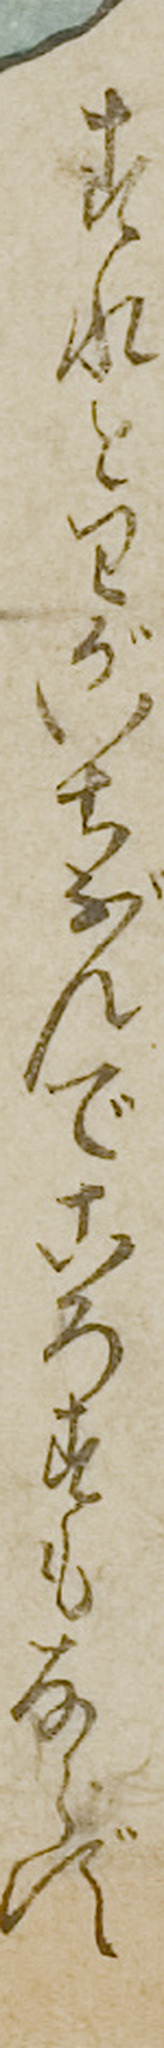すれどわがいちぶんでころすもならず
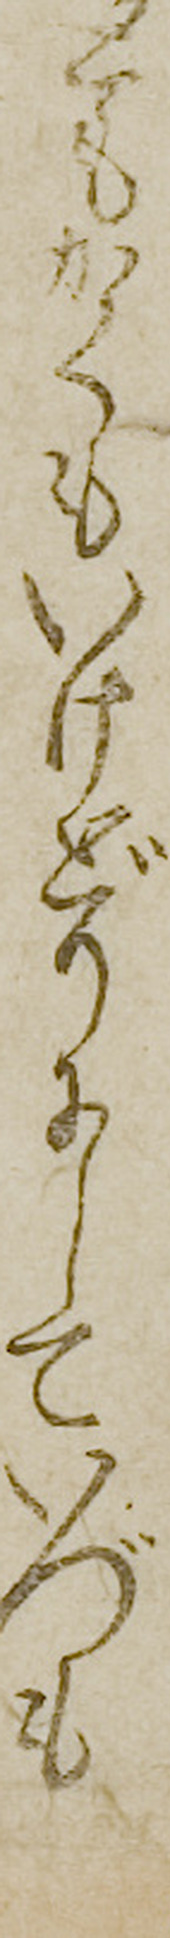ともかくもいけどりにしていづも
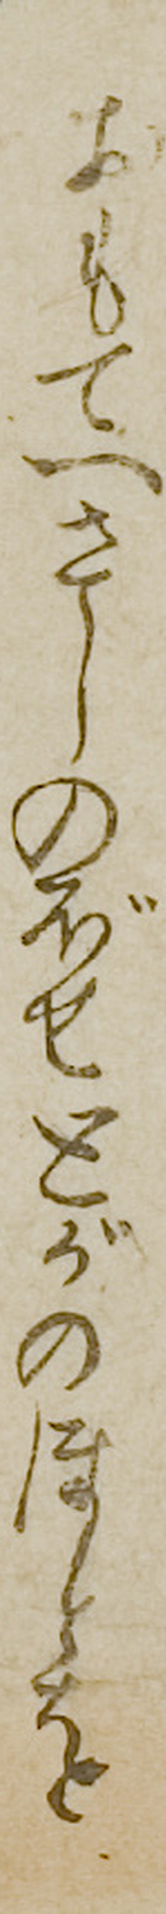おもてへさしのぼせとがのほとを
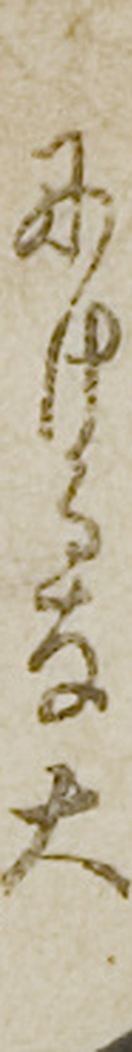にけるな大
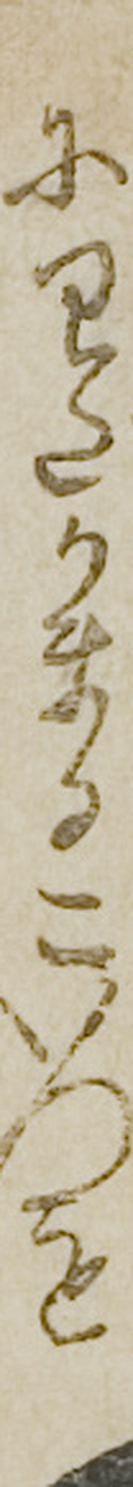にわだかまるこいつを
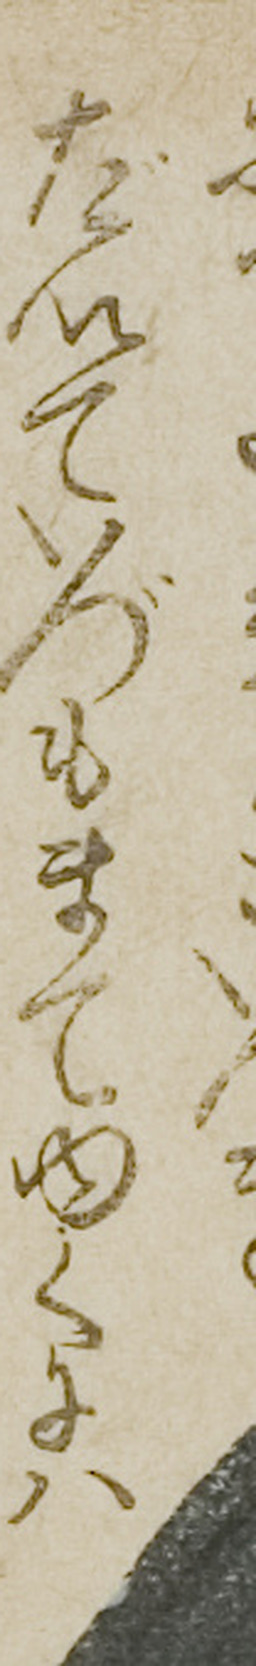だいていづもまてゆくには
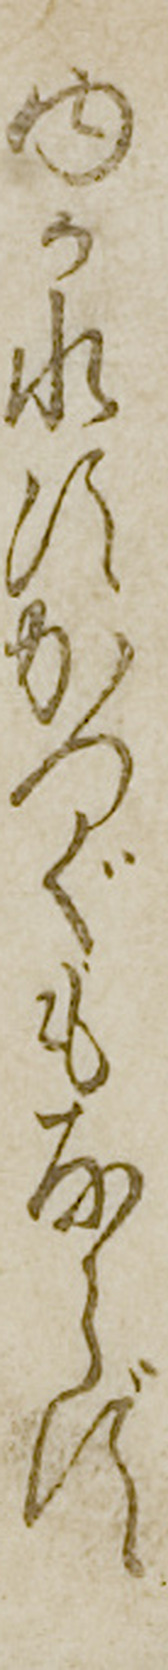ゆかれすかつぐもならず
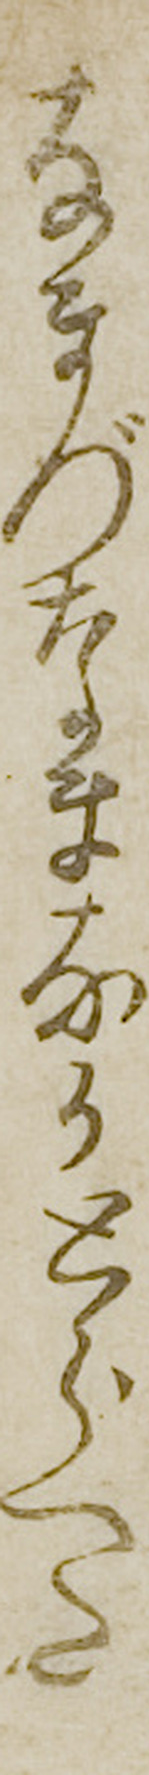なまづなまなかとらへた
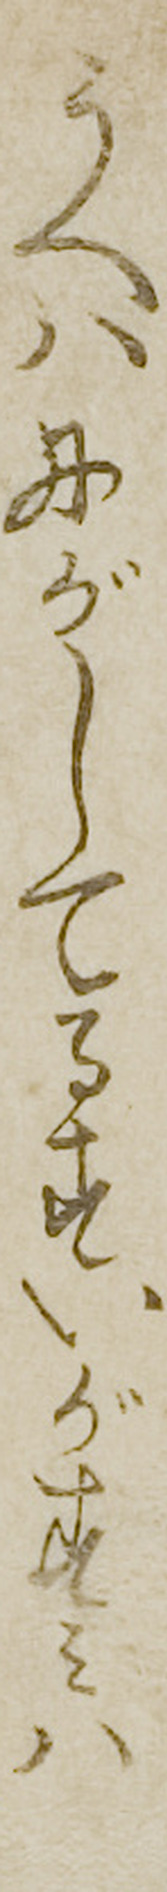うへはにがしてるすいがすみは
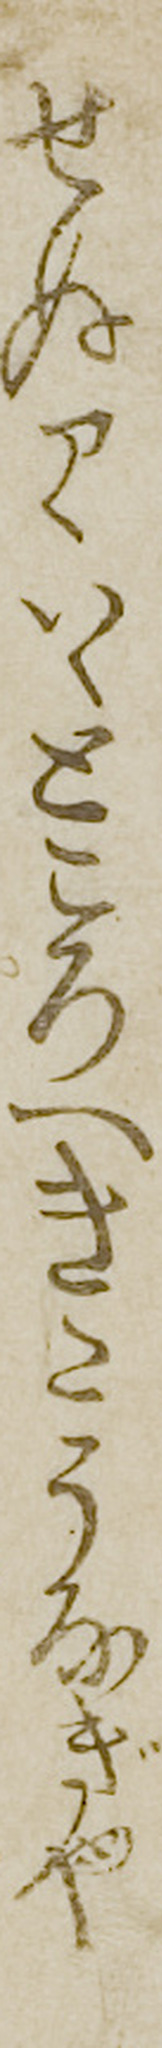せぬアヽいゝところへきたうなぎや
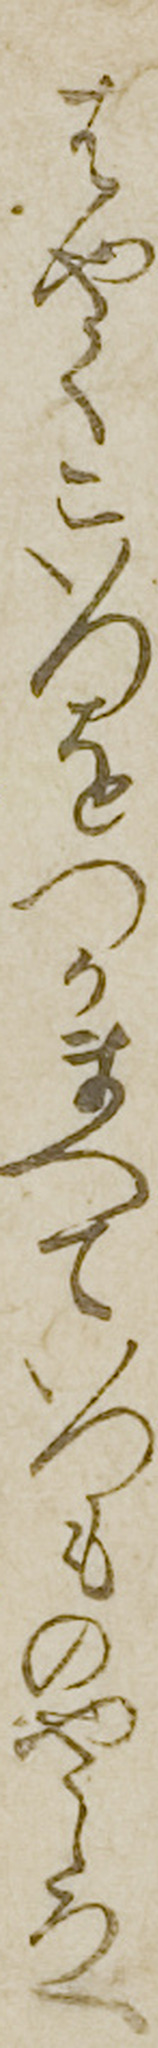はやくこいつをつかまへていづものやしろへ
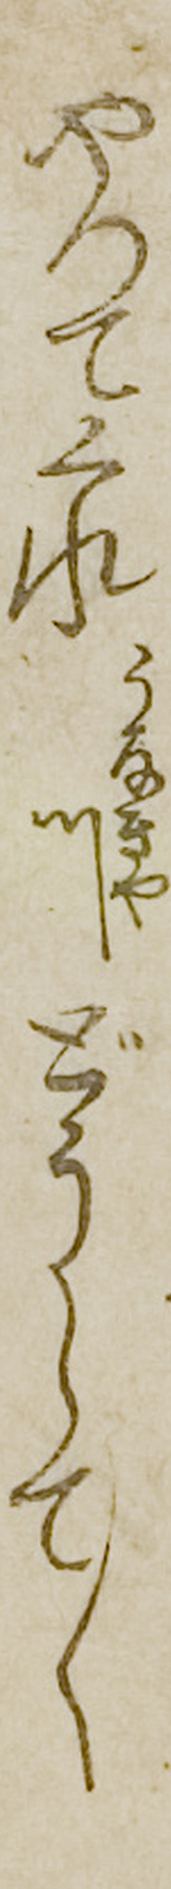やつてくれうなきや乁どうして＼
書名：[鯰を押える恵比寿]
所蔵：東京大学総合図書館 General Library in the University of Tokyo, JAPAN
